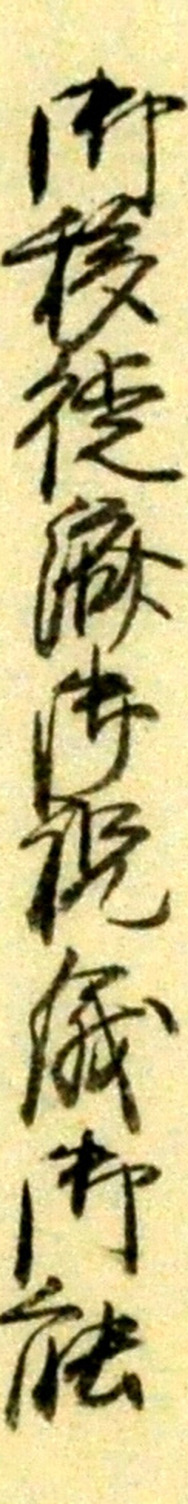御移徙済御祝儀御能
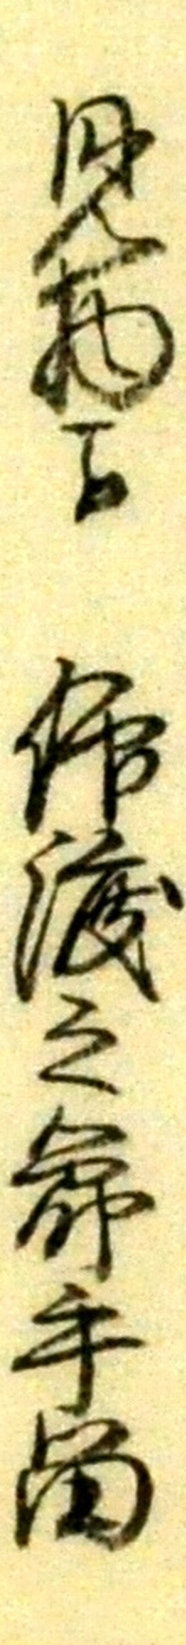見物被仰渡之節手留
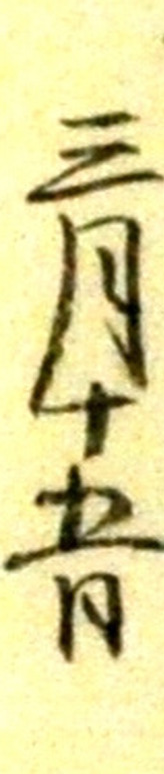三月十五日

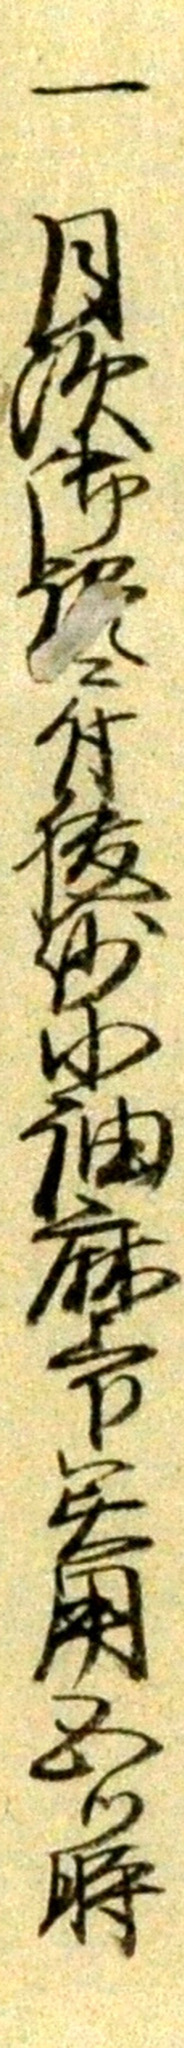一月次御礼ニ付服紗小袖麻上下着用五ツ時
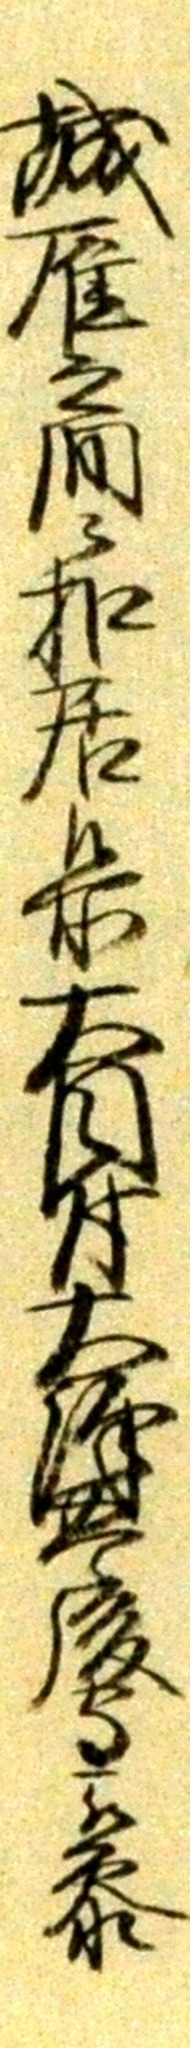城雁之間ニ扣居候所大目付大澤豊後守被参
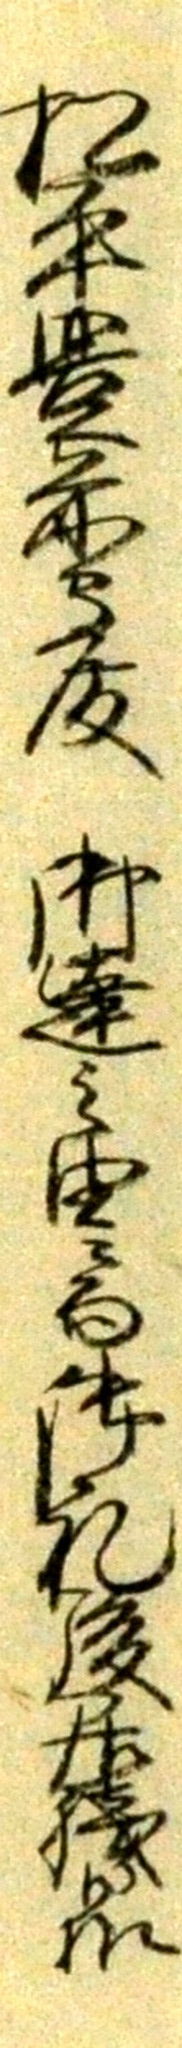松平豊前守殿御達之由ニ而御礼後居残り候様
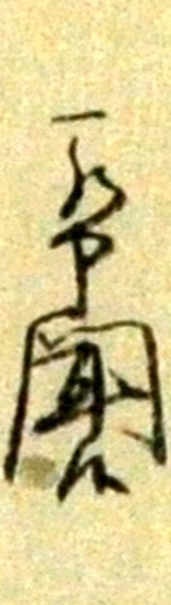被申聞候
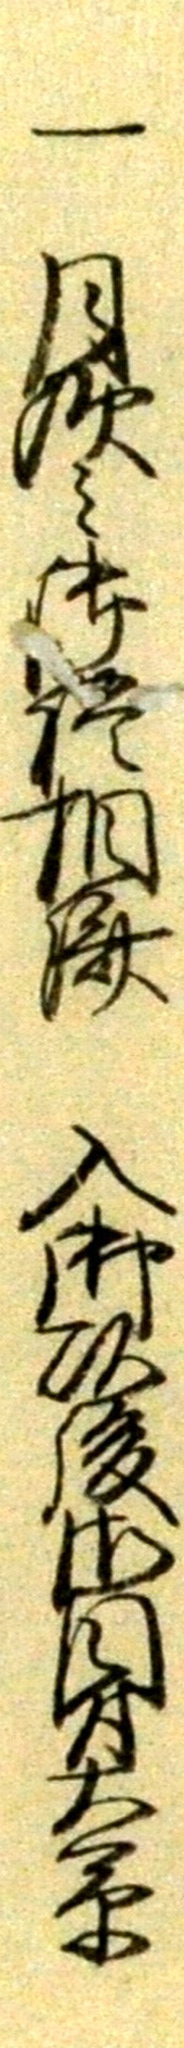一月次之御礼相済入御以後御目付大草
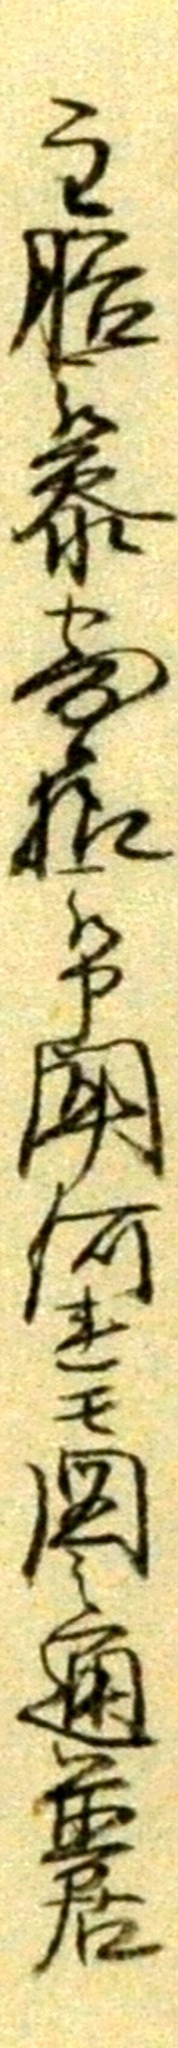主膳被参寄候様被申聞何れモ図之通並居
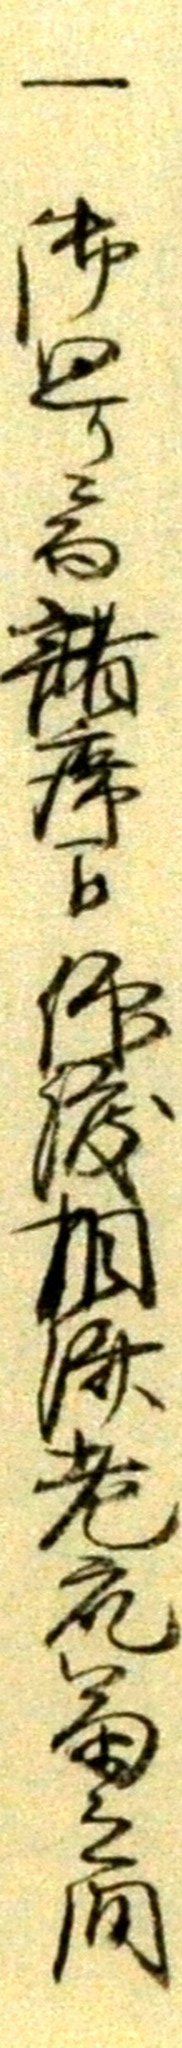一御廻りニ而諸席被仰渡相済老衆菊之間
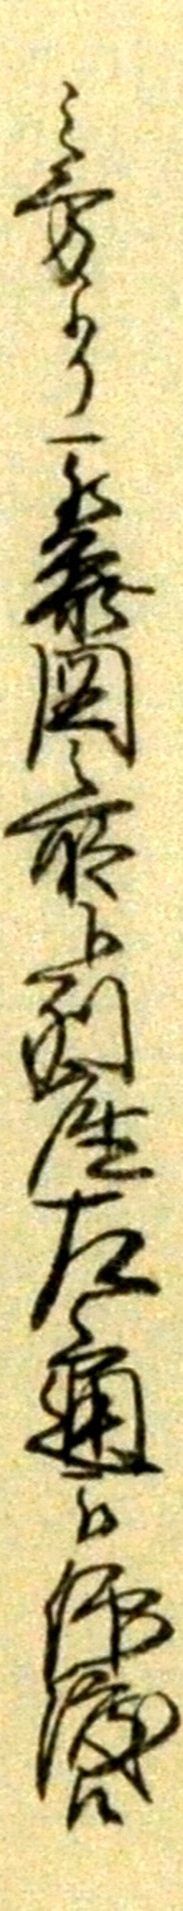之方より被参図之所え列座左之通被仰渡候
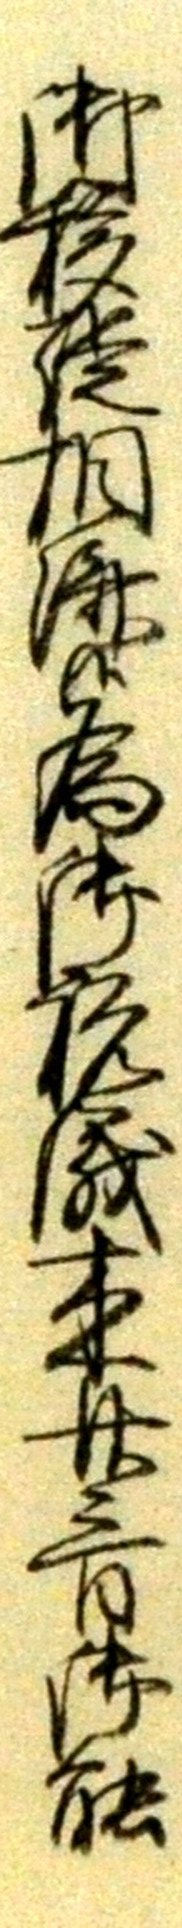御移徙相済候為御祝儀来廿三日御能
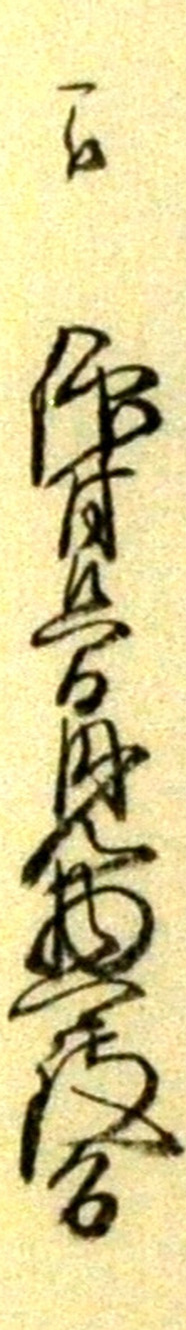被仰付候間見物可致旨

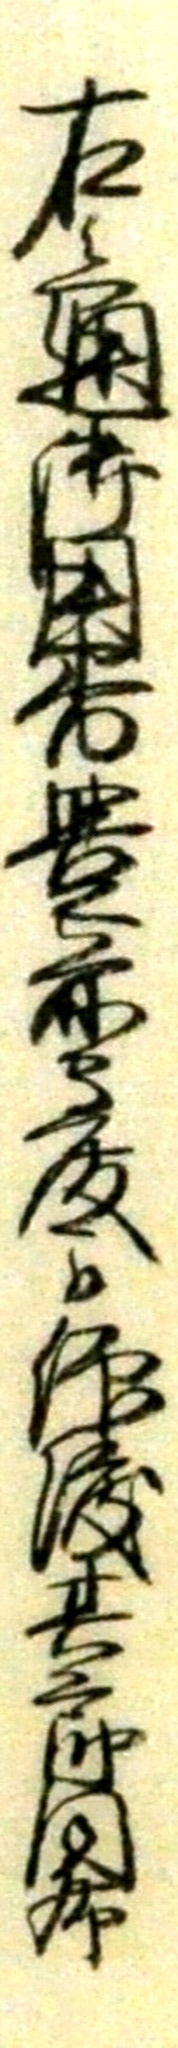右之通御用番豊前守殿被仰渡其節同席
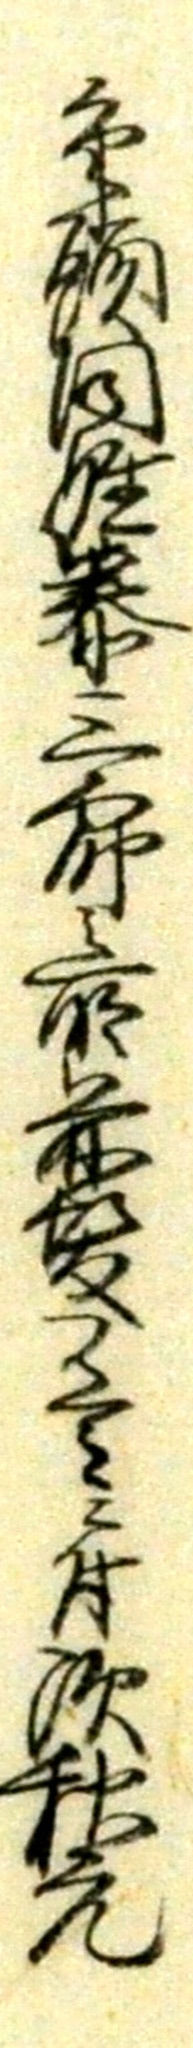筆頭同姓恭三郎之所前髪有之ニ付次秋元
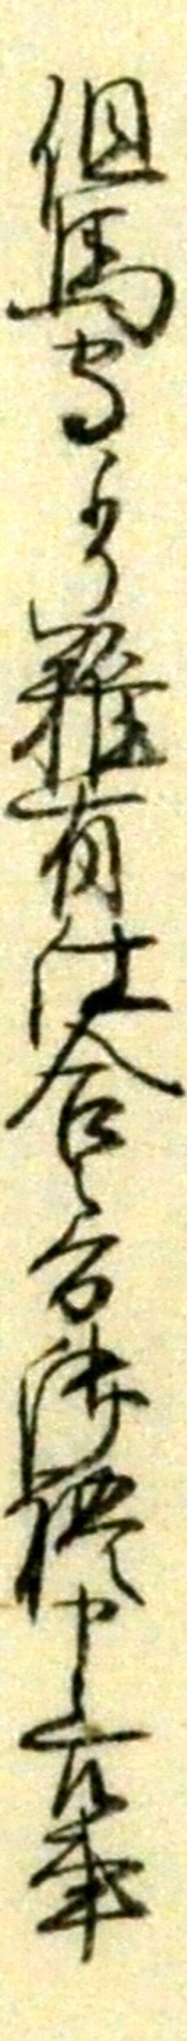但馬守より難有仕合之旨御礼申上候事
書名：御移徒相済御祝儀御能ノ節ノ留外
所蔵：伊那市立高遠町図書館・合同会社AMANE
